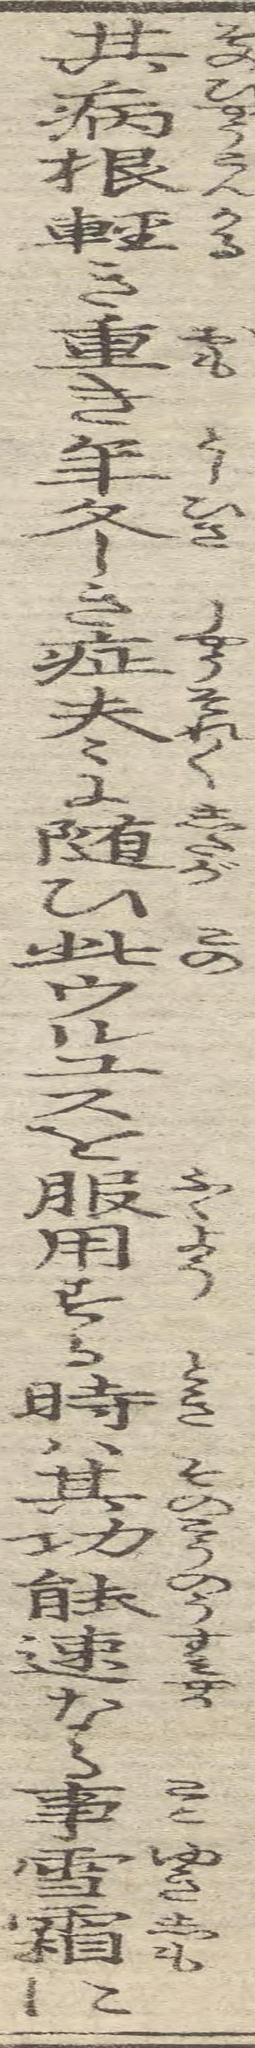其病根軽き重き年久しき症夫々に随ひ此ウルユスを服用する時は其功能速なる事雪霜に
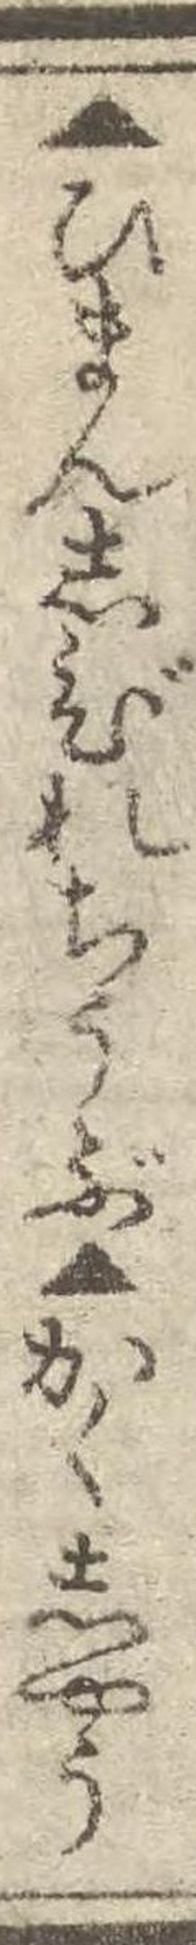▲ひまんしびれちうぶ▲かくしやう
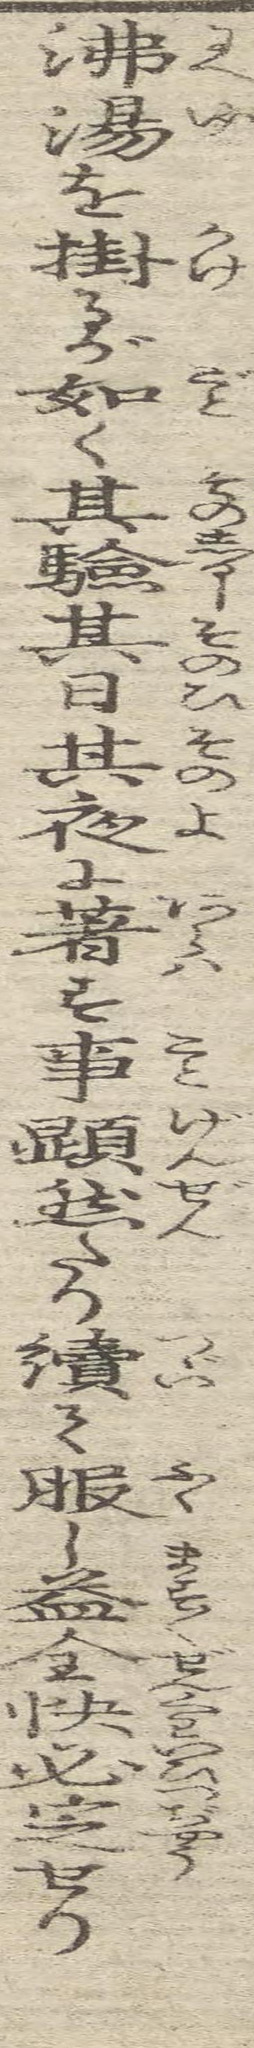沸湯を掛るが如く其験其日其夜に著す事顕然たり続て服し益全快必定せり
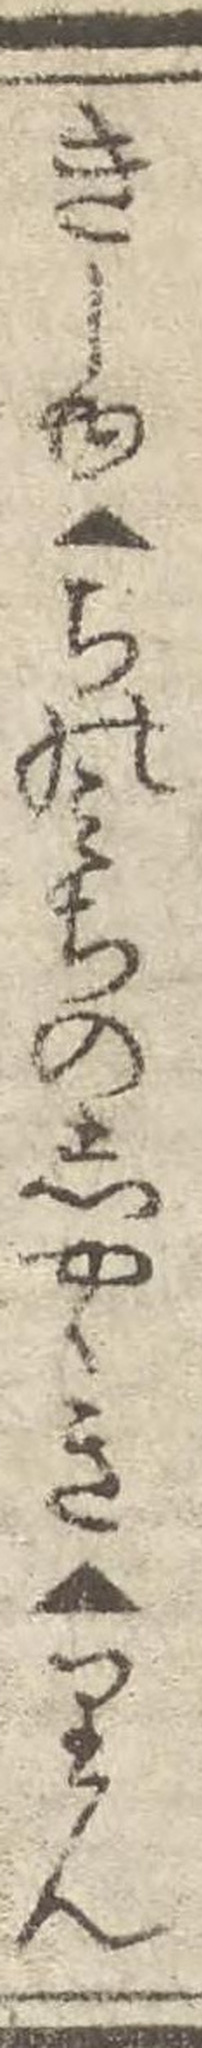きしゆ▲ちのみちのしやくき▲りん
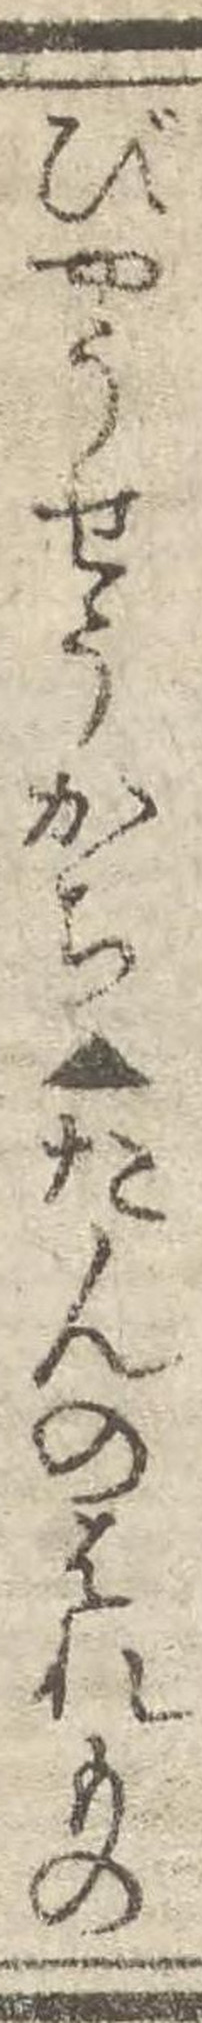びやうせうかち▲たんのはれもの
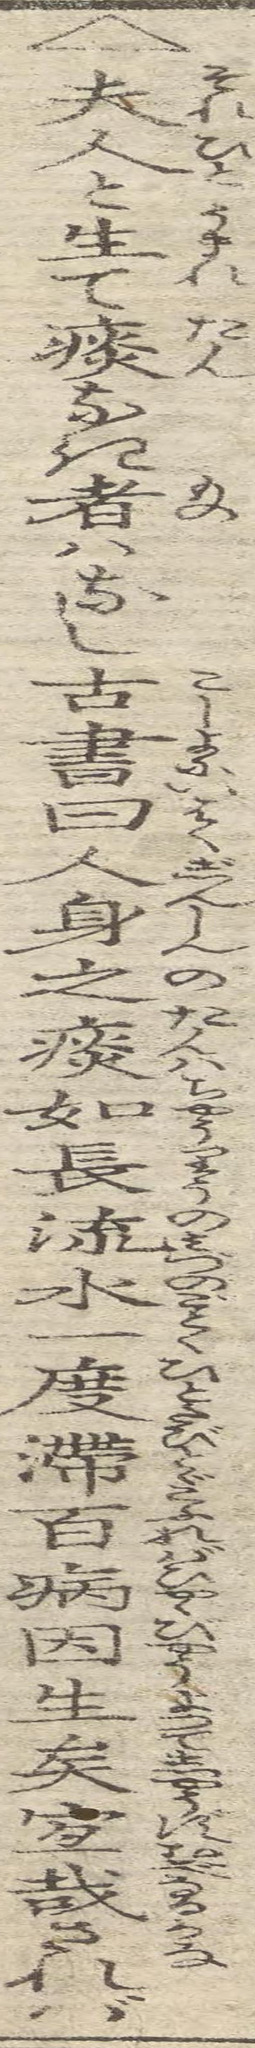△夫人と生て痰なき者はなし古書曰人身之痰如長流水一度滞百病因生矣宜哉されば
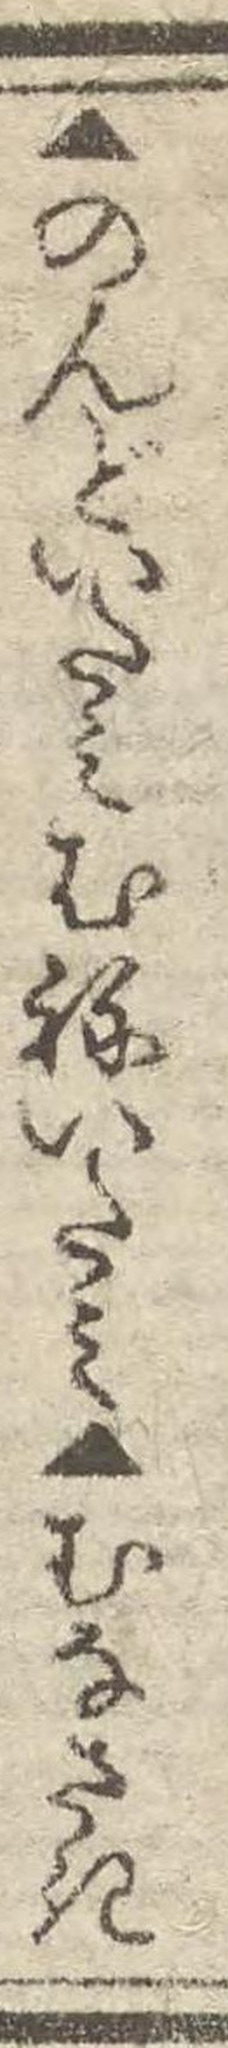▲のんどいたみむねいたみ▲むなさき
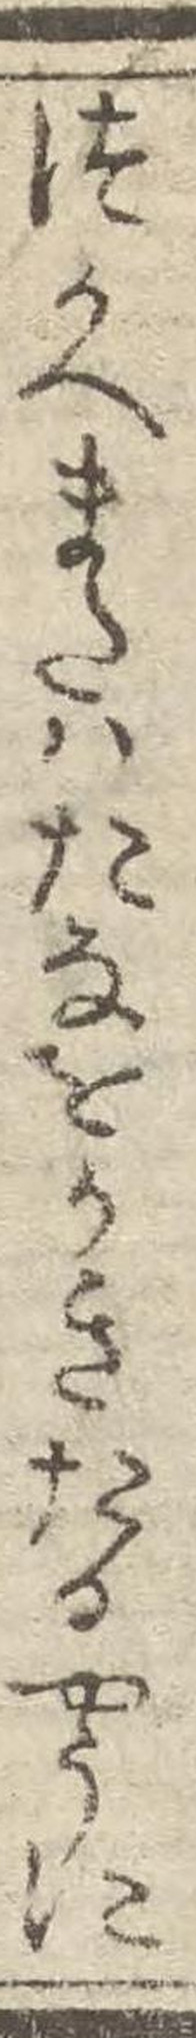つかへまたはたなをかきたるやうに
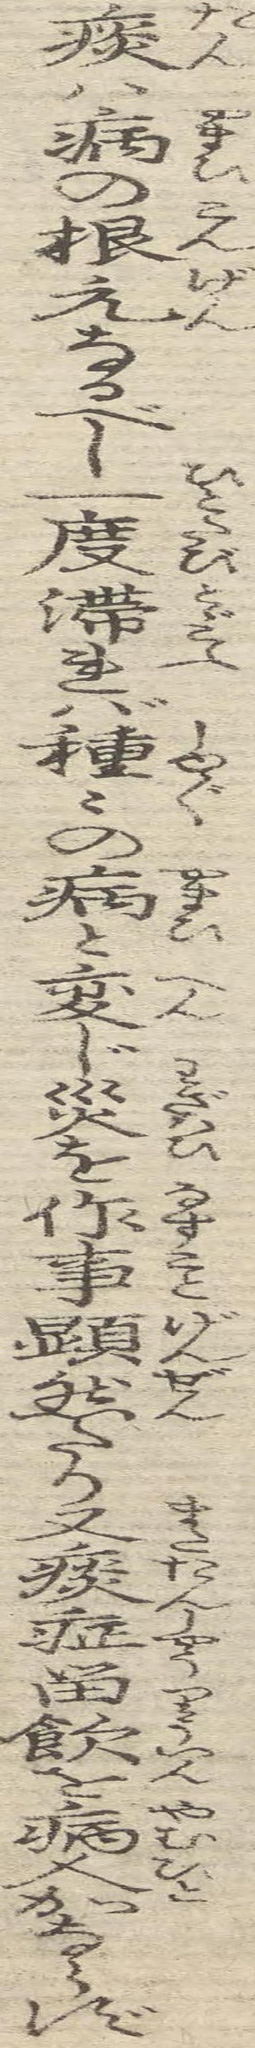痰は病の根元なるべし一度滞れば種々の病と変じ災を作事顕然たり又痰症留飲を病人かならず
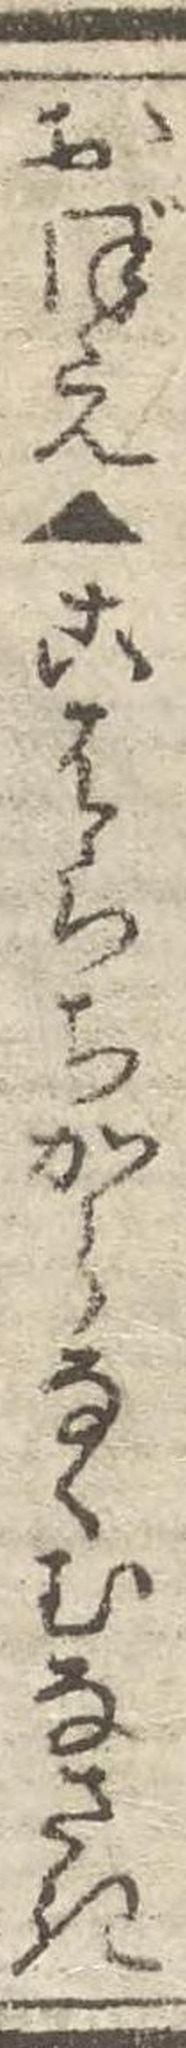おぼえ▲こはらちからなくむなさき
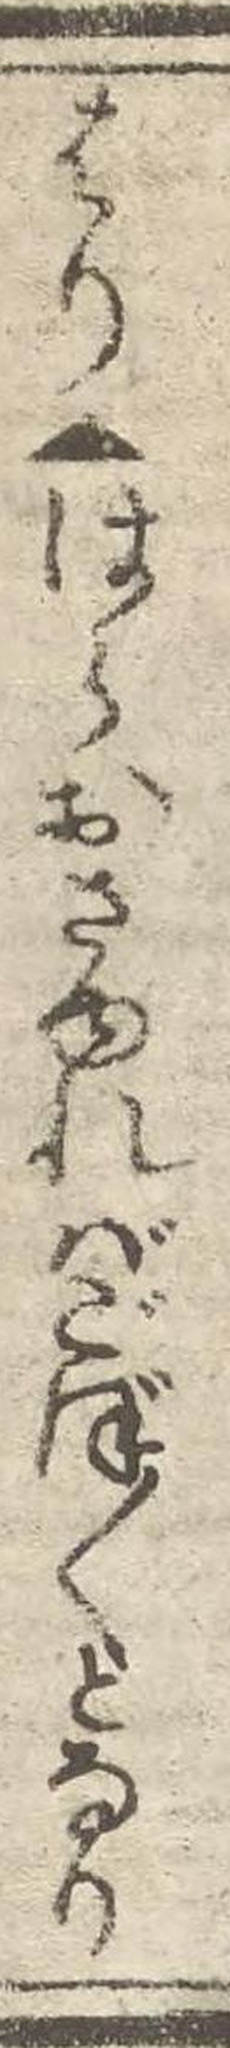はり▲はらおさゆればごぼ〳〵となり
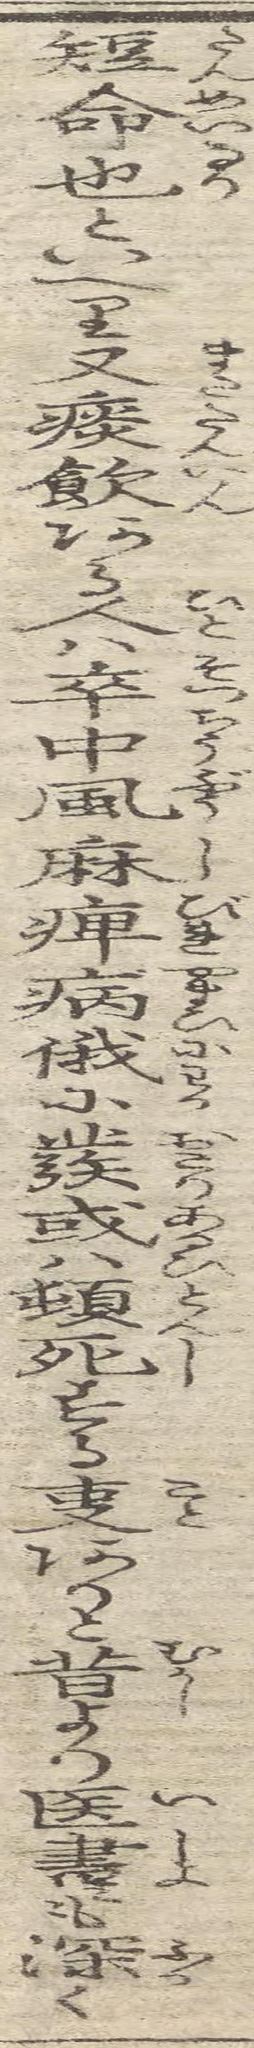短命也といへり又痰飲ある人は卒中風麻痺病俄に発或は頓死する事ありと昔より医書にも深く
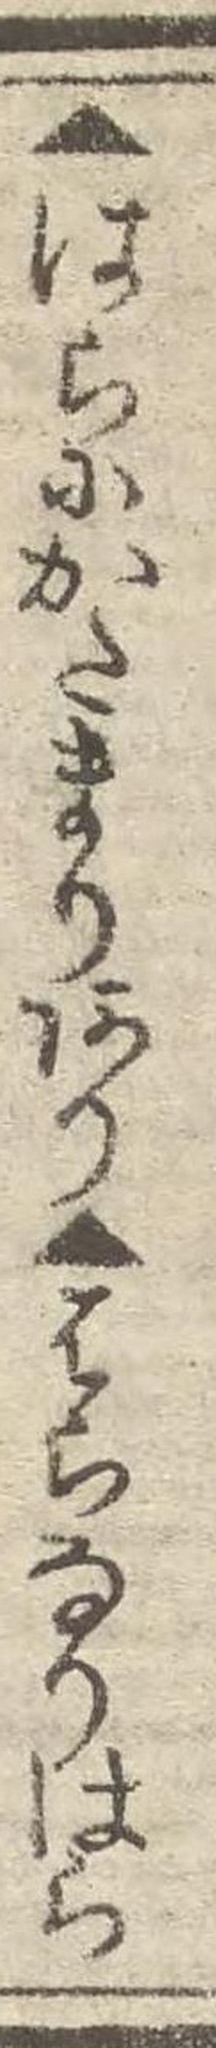▲はらにかたまりあり▲はらなりはら
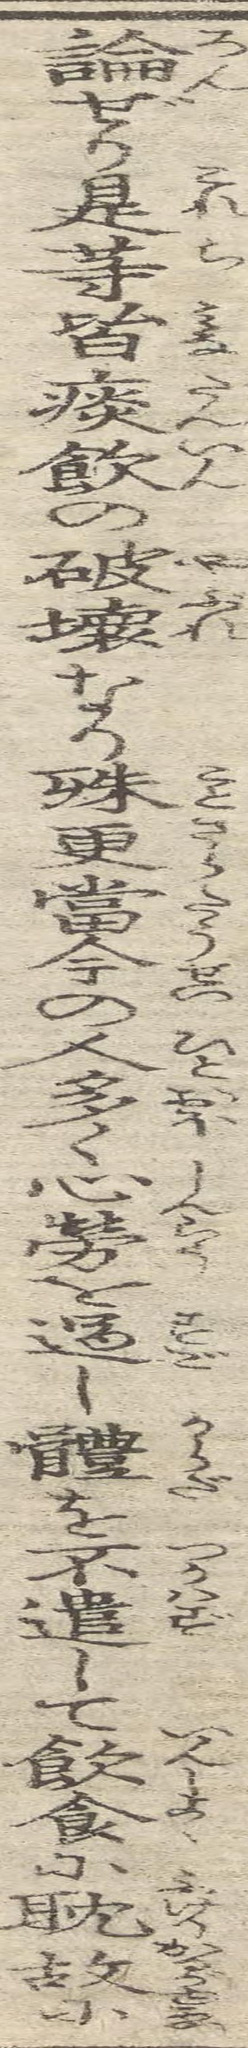論ぜり是等皆痰飲の破壊なり殊更当今の人多く心労を過し体を不遣して飲食に耽故に
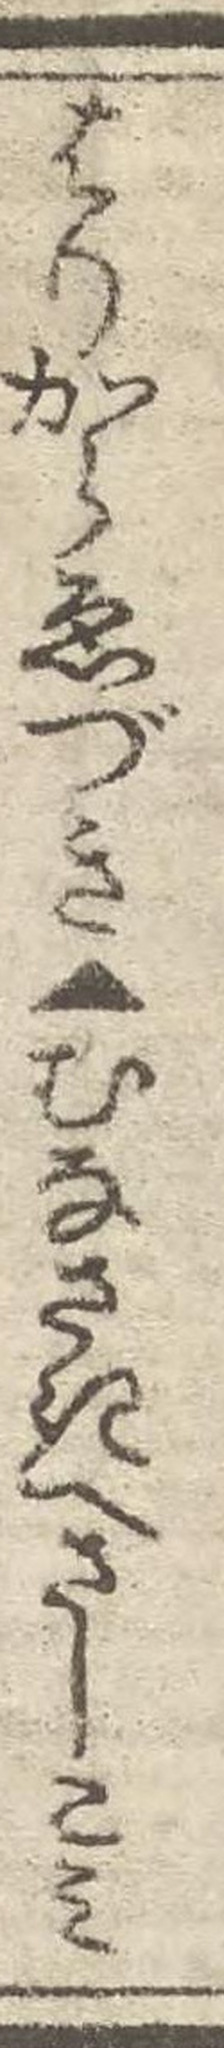はりからゑづき▲むなさきへさしこみ
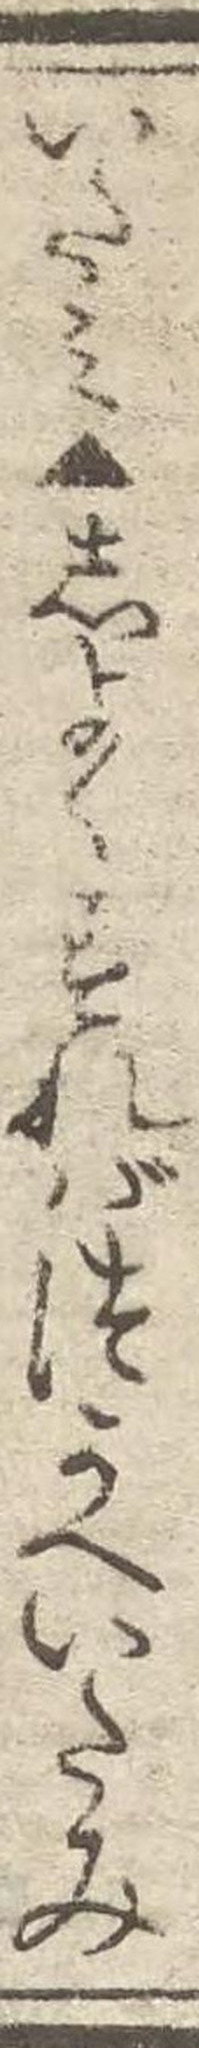いたみ▲しよくすればつかへいたみ
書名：浪華薬種問屋能書張交帖. 一
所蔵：国立国会図書館 National Diet Library, JAPAN
